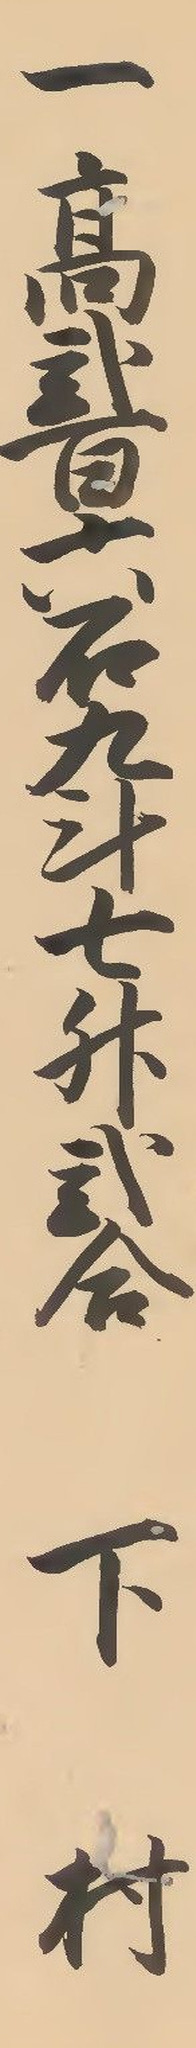一髙弐百六石九斗七升弐合下村
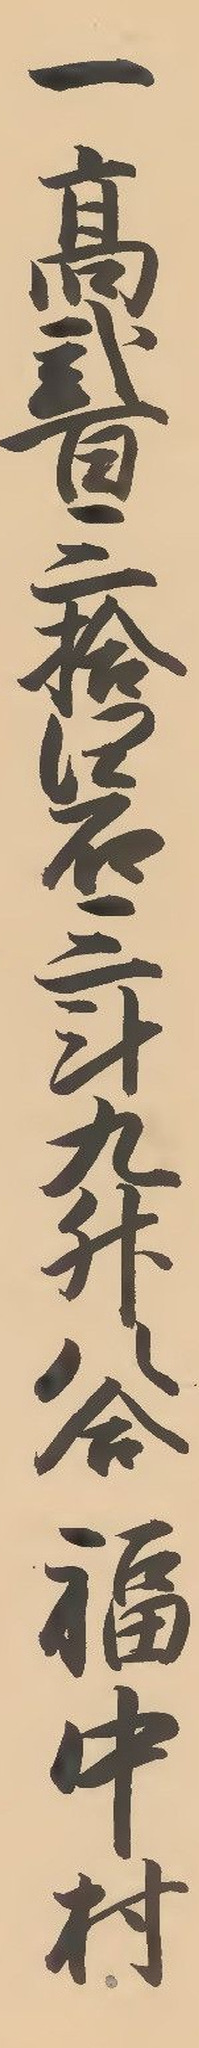一髙弐百三拾四石三斗九升八合福中村
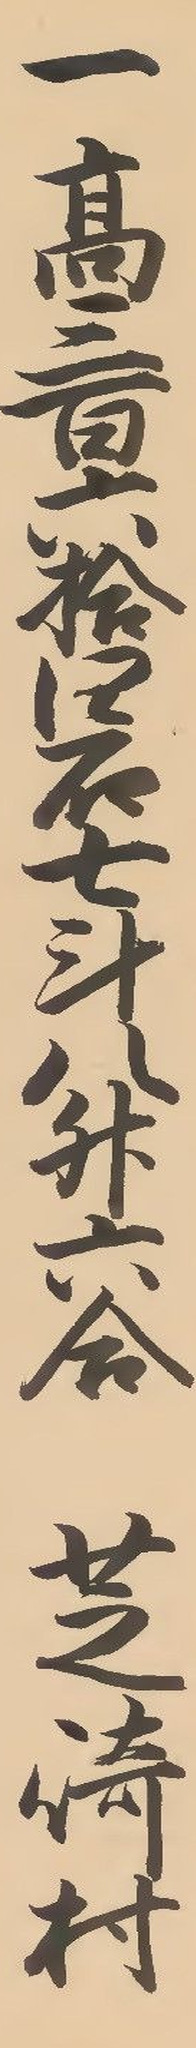一髙三百六拾四石七斗八升六合柴崎村
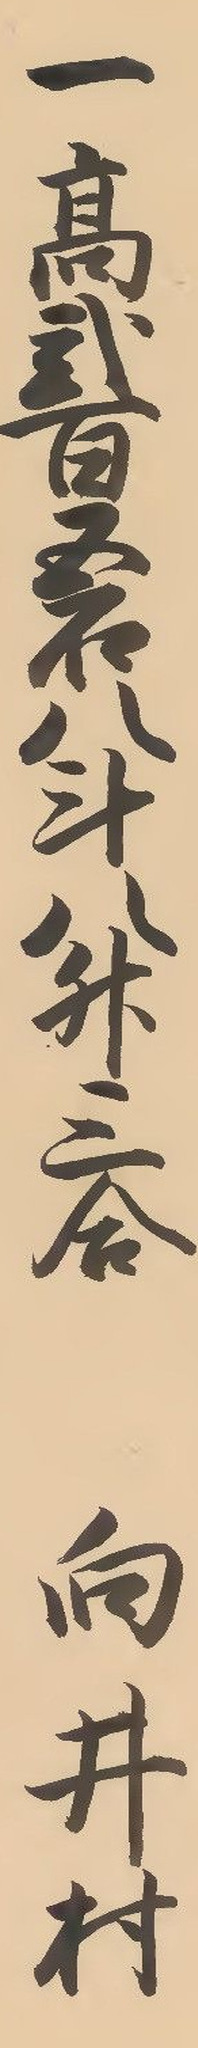一髙弐百五石八斗八升三合向井村
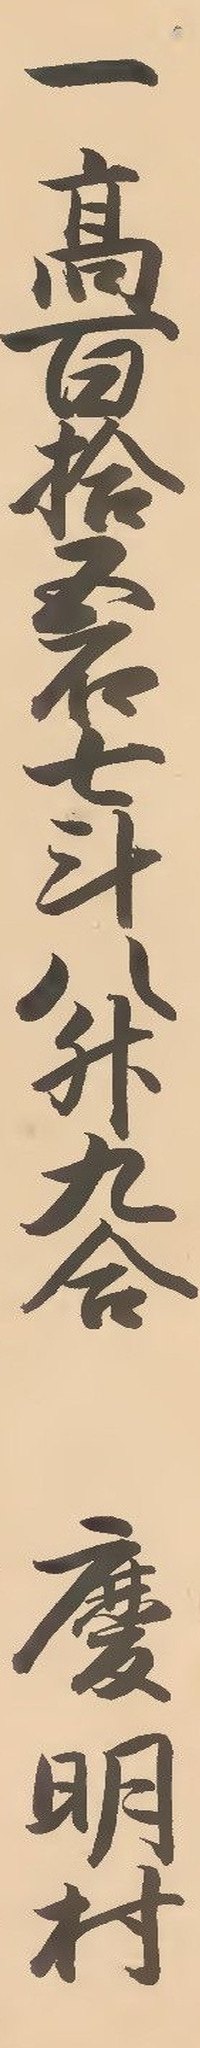一髙百拾五石七斗八升九合慶明村
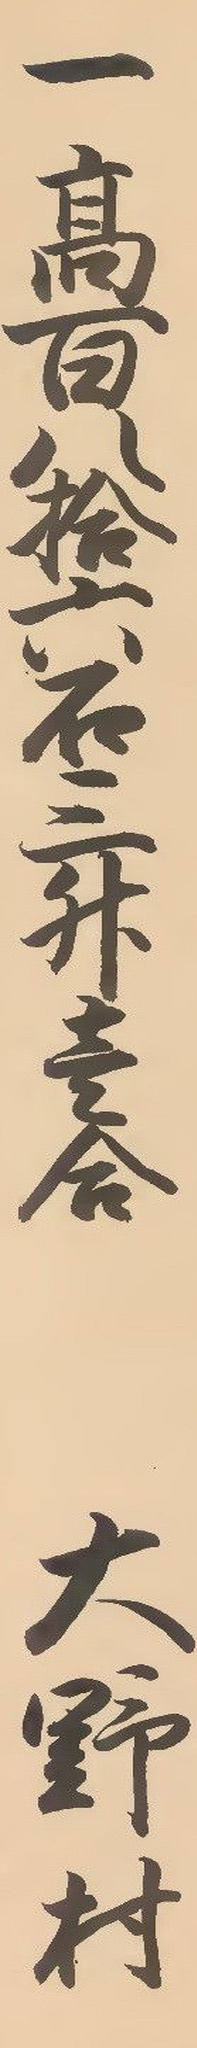一髙百八拾六石三升壱合大野村
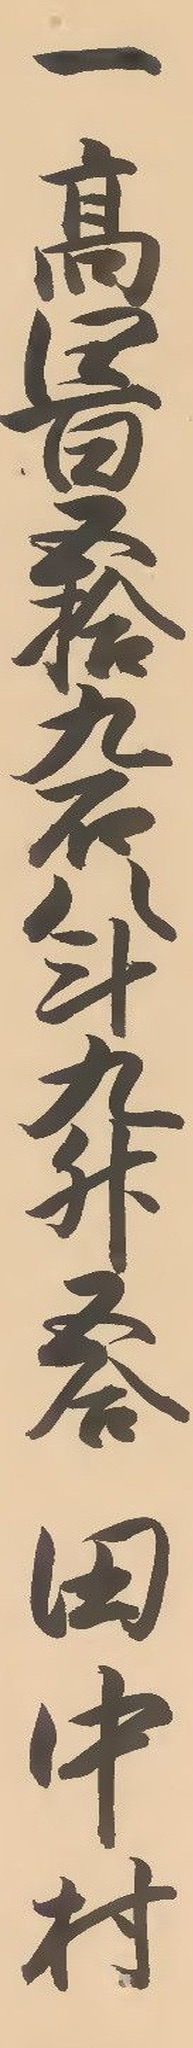一髙四百五拾九石八斗九升五合田中村
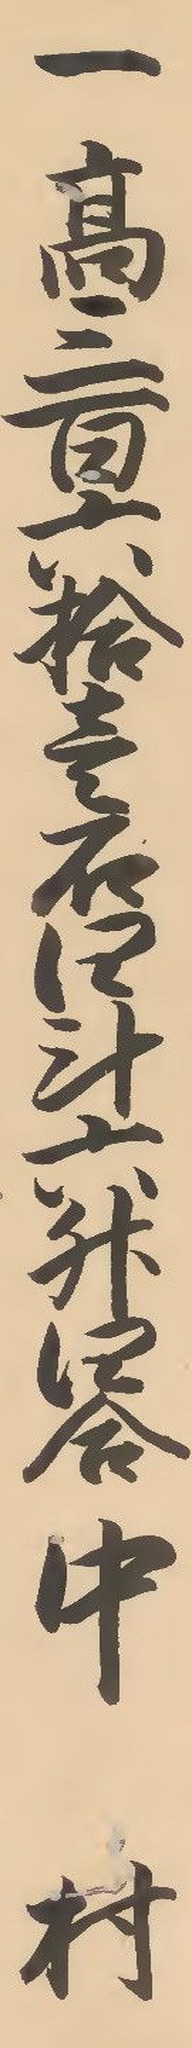一髙三百六拾壱石四斗六升四合中村

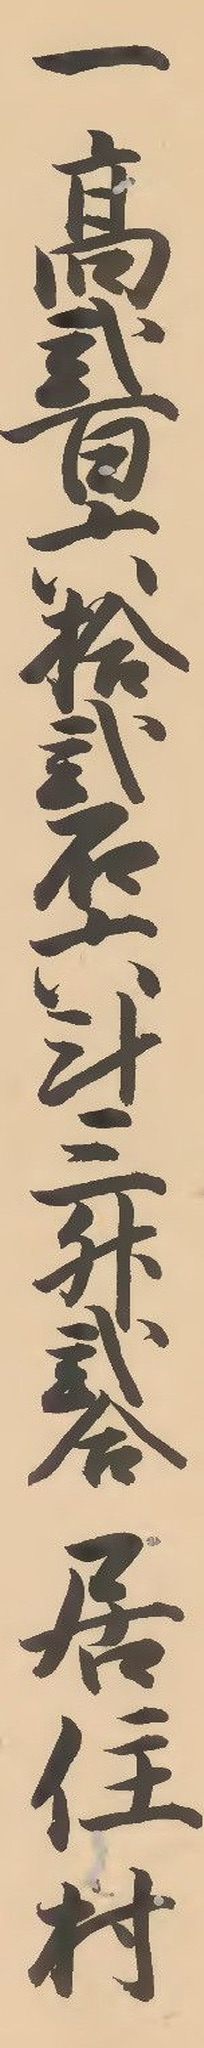一髙弐百六拾弐石六斗三升弐合居住村
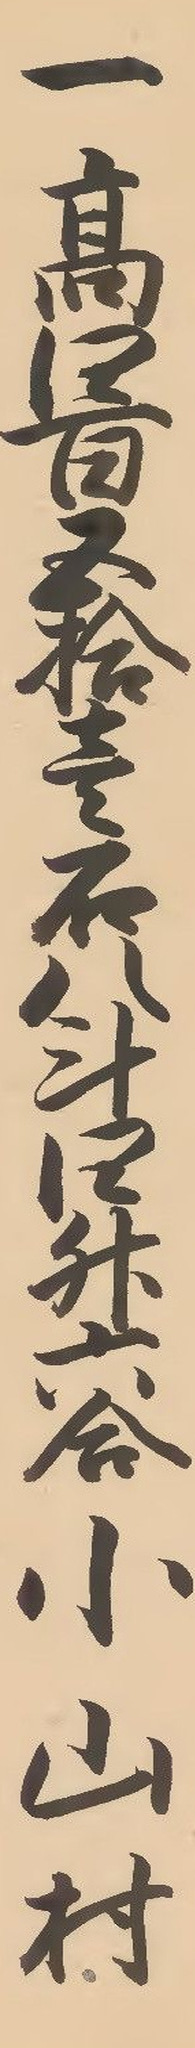一髙四百五拾壱石八斗四升六合小山村
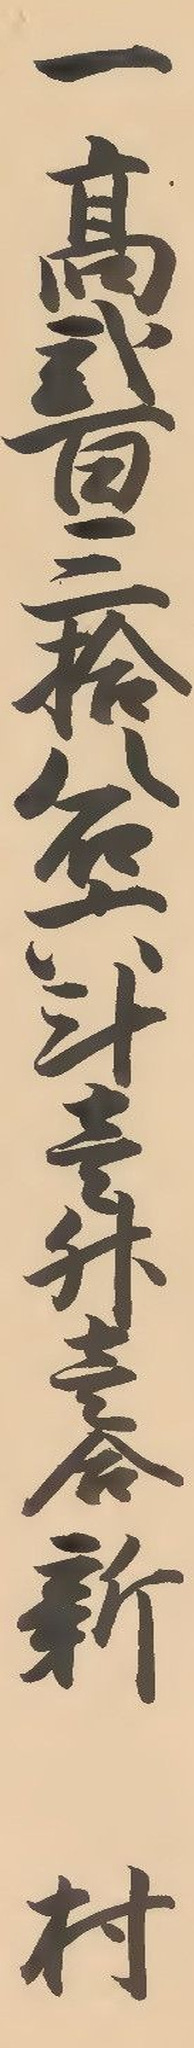一髙弐百三拾八石六斗壱升壱合新村
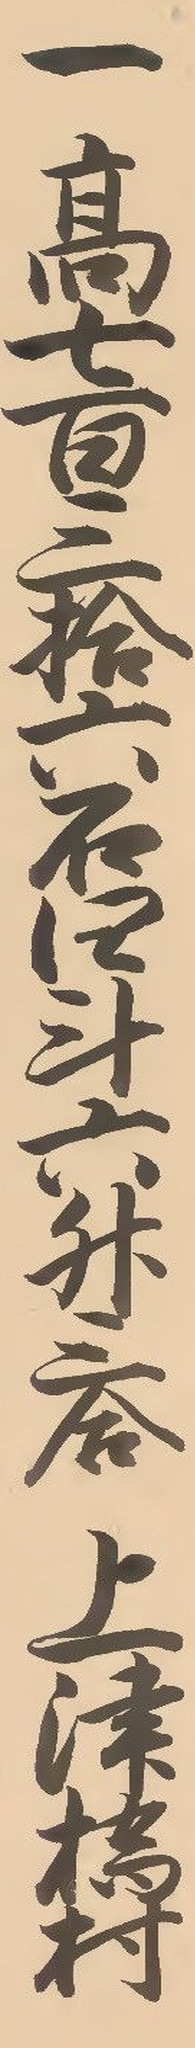一髙七百三拾六石四斗六升三合上津橋村
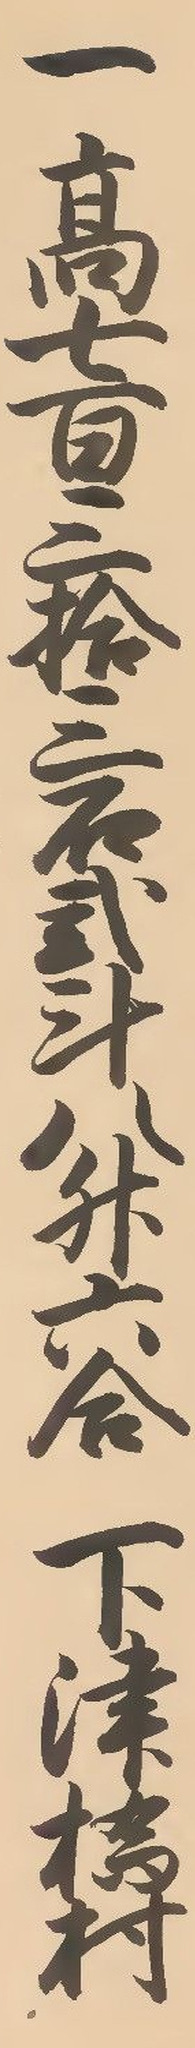一髙七百三拾三石弐斗八升六合下津橋村
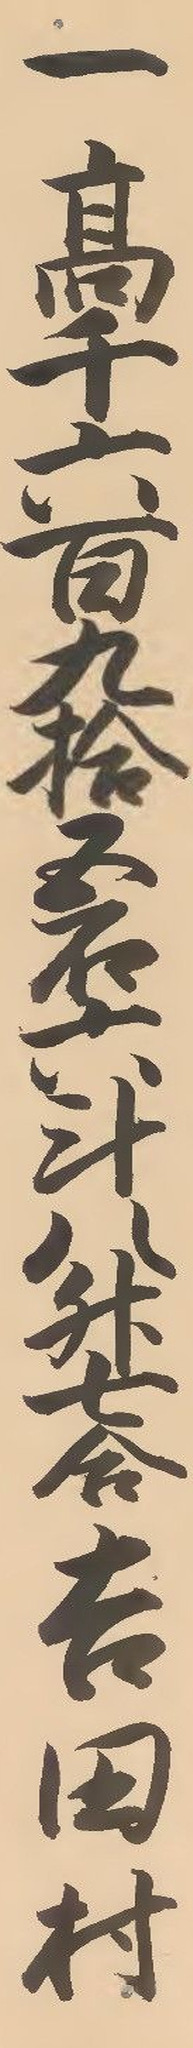一髙千六百九拾五石六斗八升七合吉田村
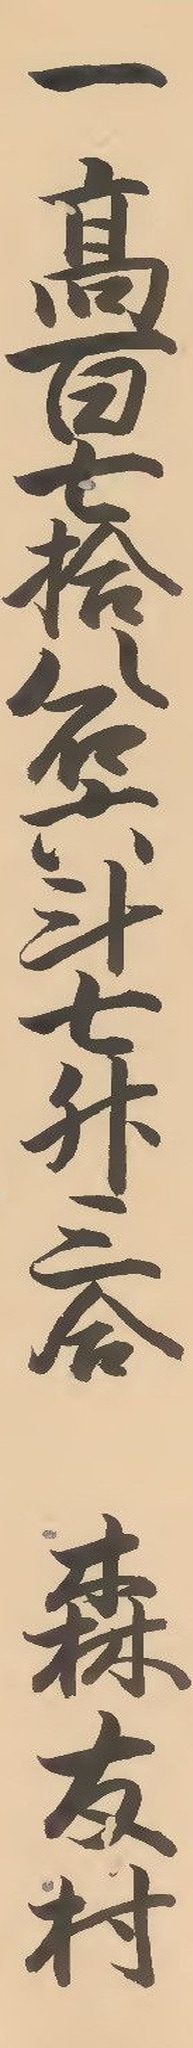一髙百七拾八石六斗七升三合森友村

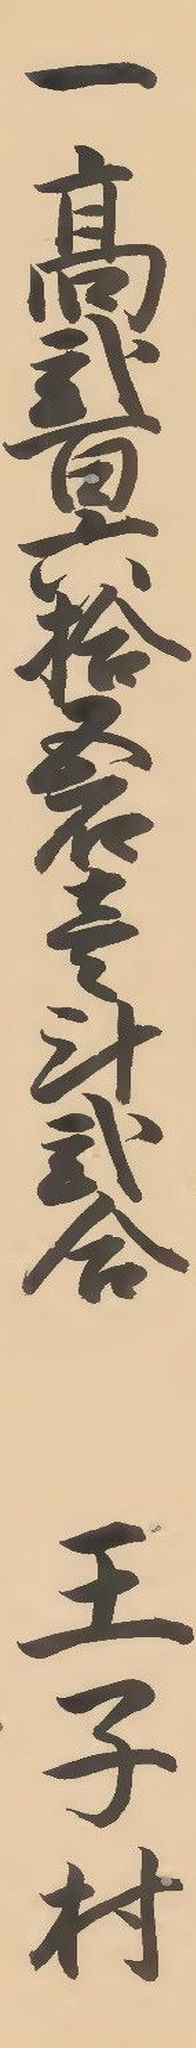一髙弐百六拾五石壱斗弐合王子村
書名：播磨国郷帳
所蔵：国立公文書館 National Archives of Japan
